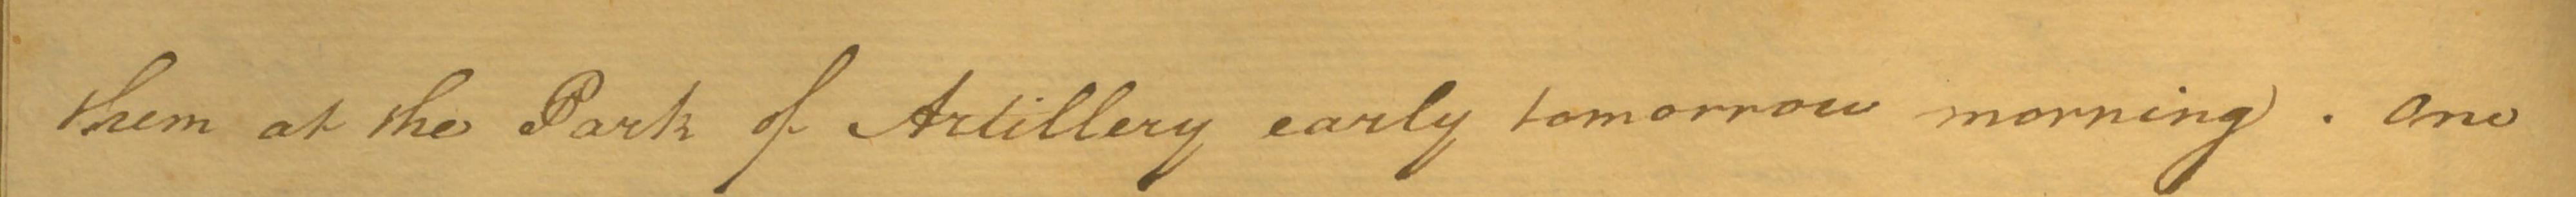them at the Park of Artillery early tomorrow morning. One
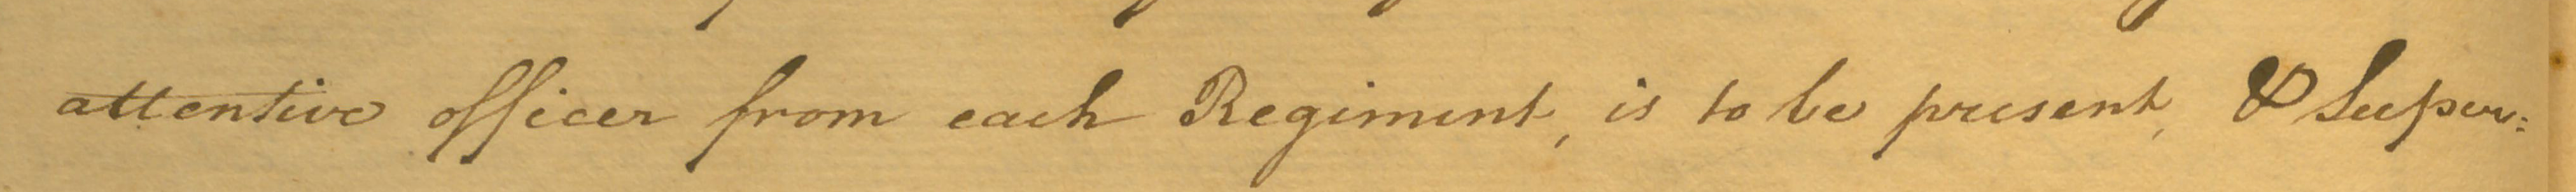attentive officer from each Regiment, is to be present & Super-
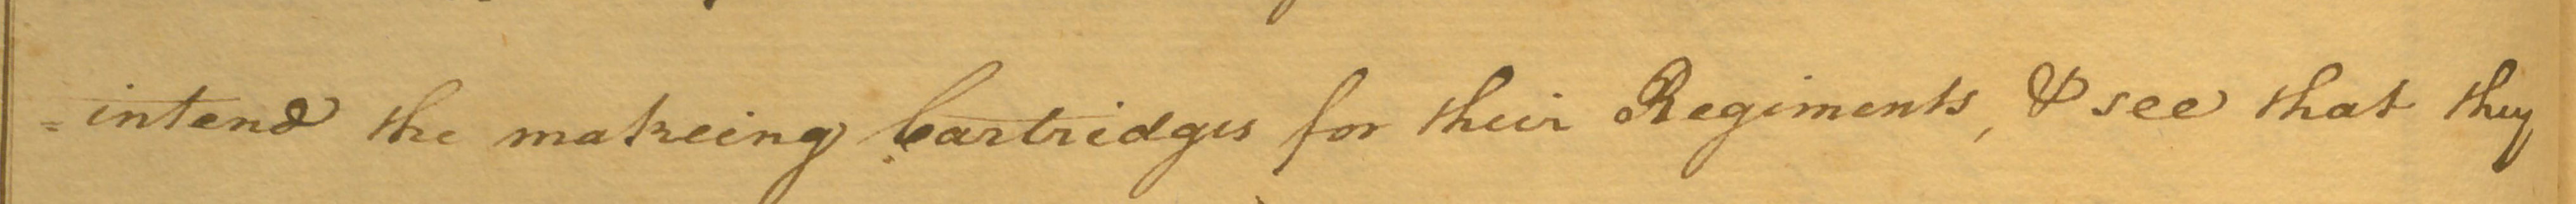-intend the makeing Cartridges for their Regiments, & see that they
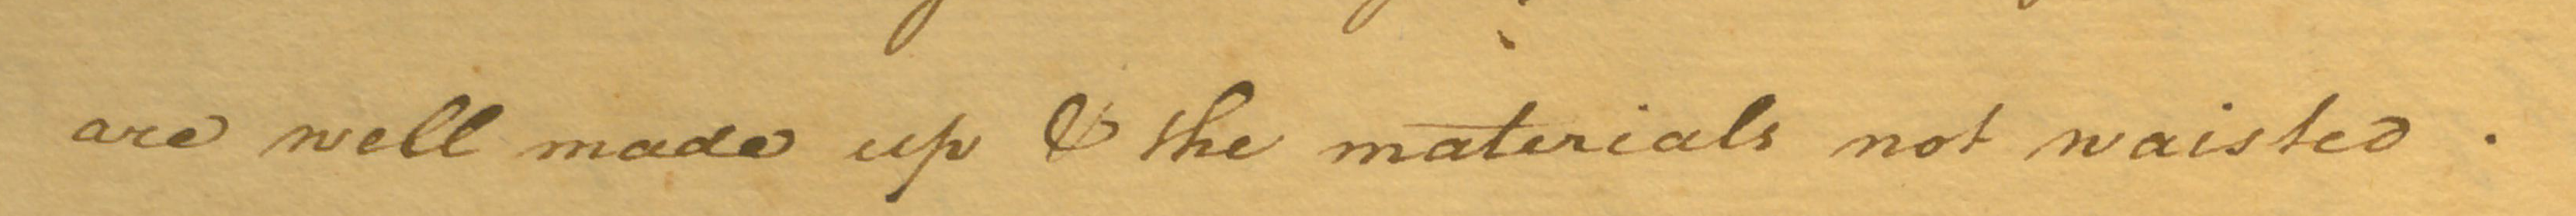are well made up & the materials not waisted.
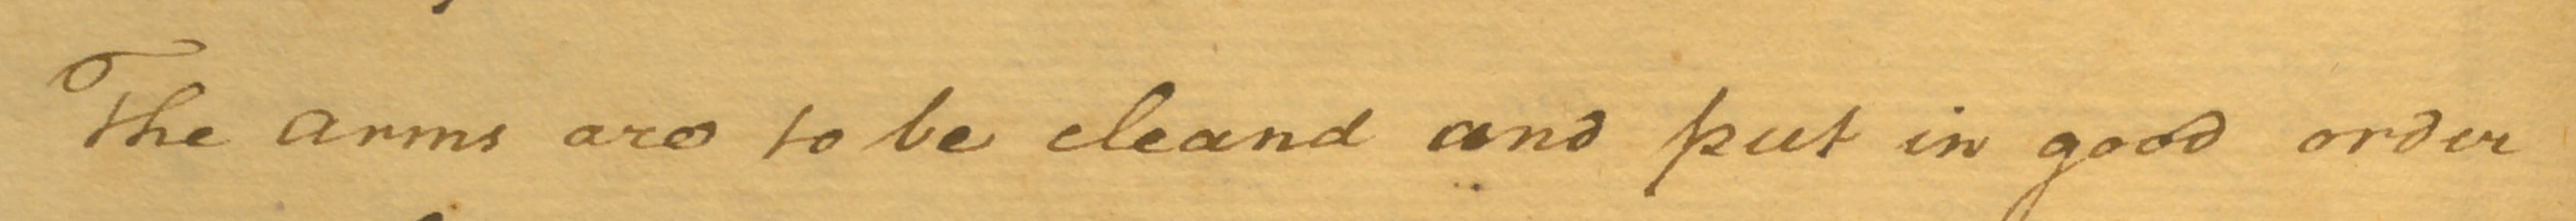The Arms are to be cleand and put in good order
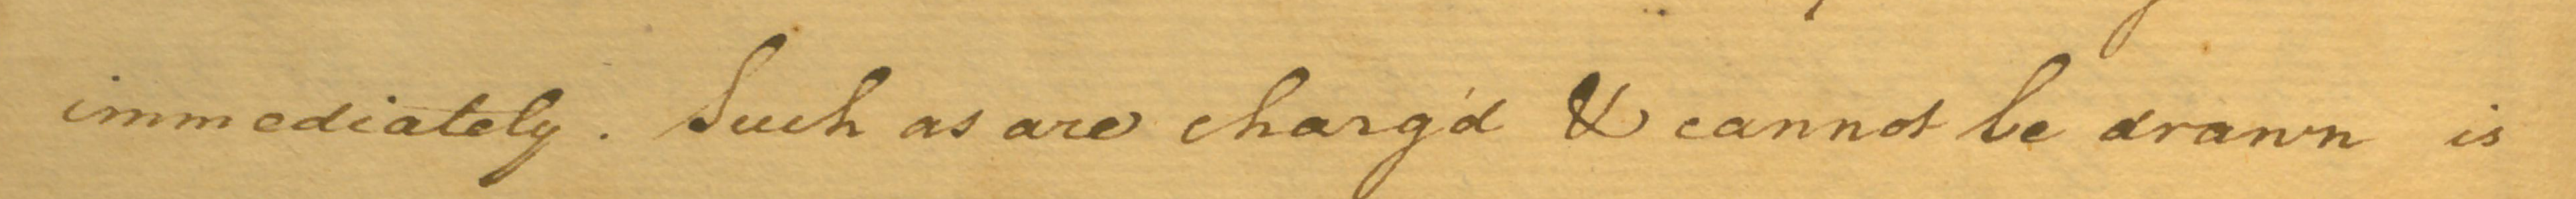immediately. Such as are charg'd & cannot be drawn is
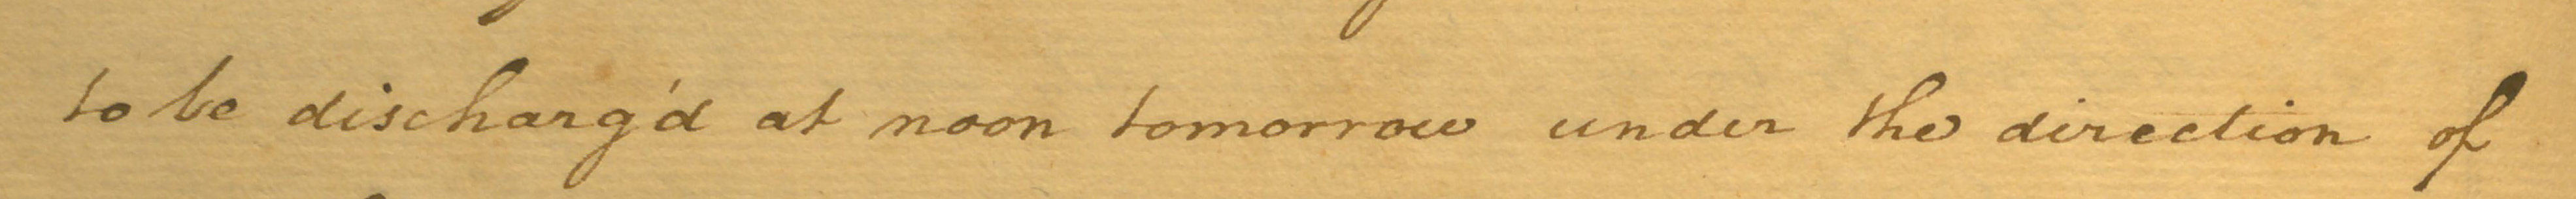to be discharg'd at noon tomorrow under the direction of
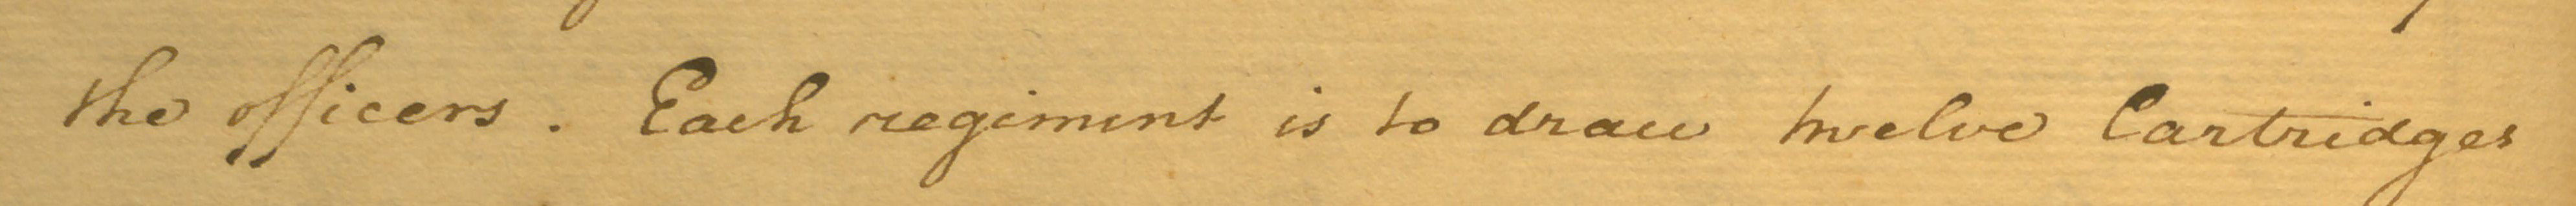the officers. Each regiment is to draw twelve Cartridges
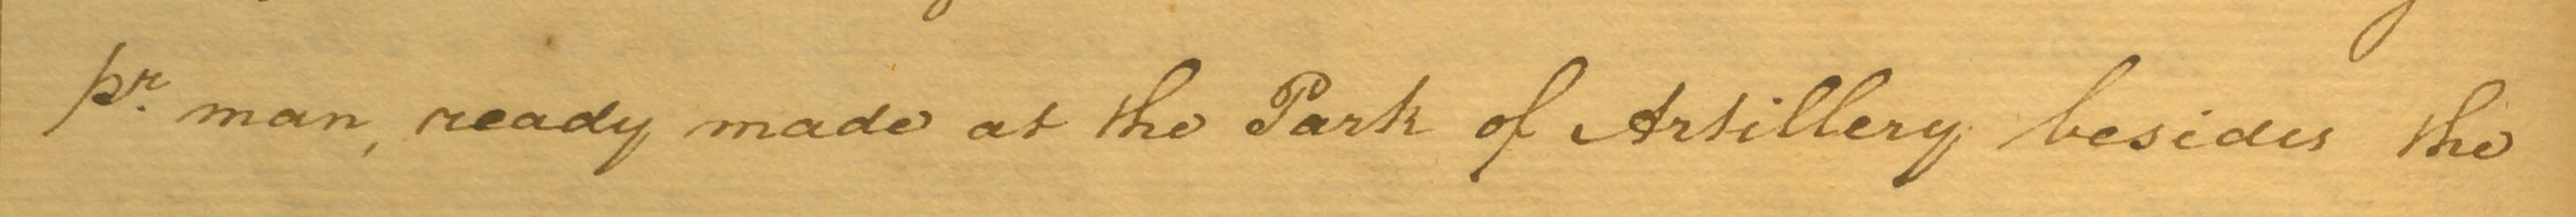p^r. man, ready made at the Park of Artillery besides the
